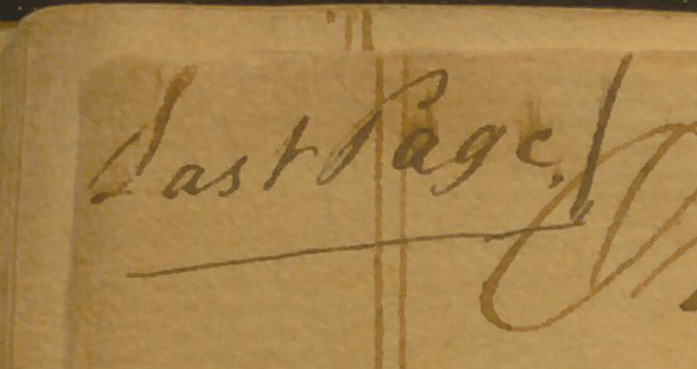Last Page.
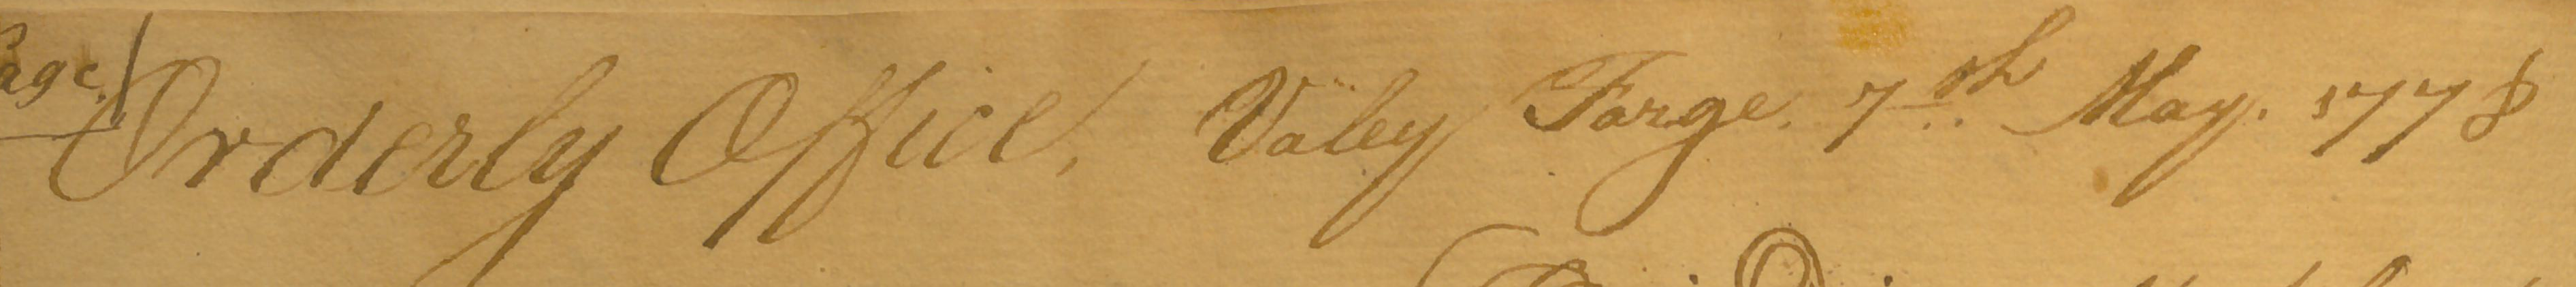Orderly Office Valey Forge 7^th. May 1778
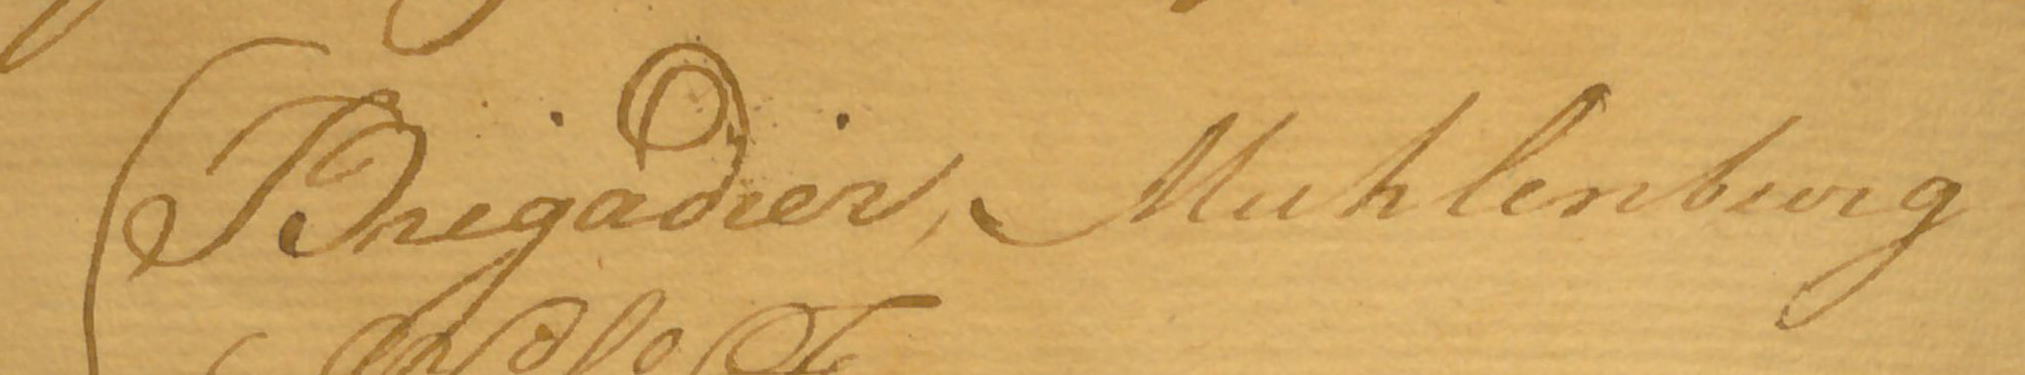Brigadier, Muhlenburg
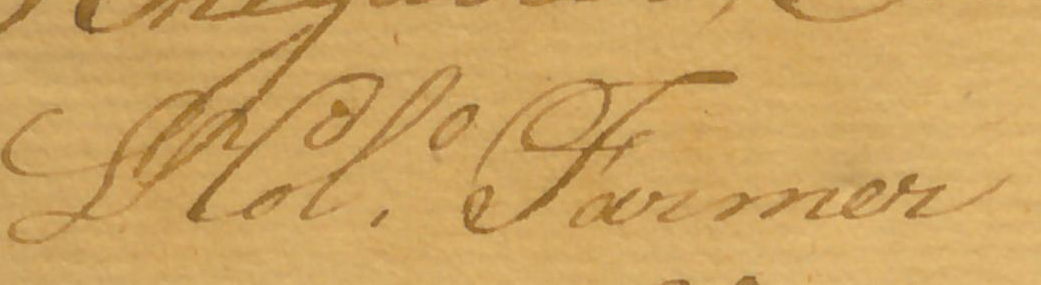L^t. Col^o. Farmer
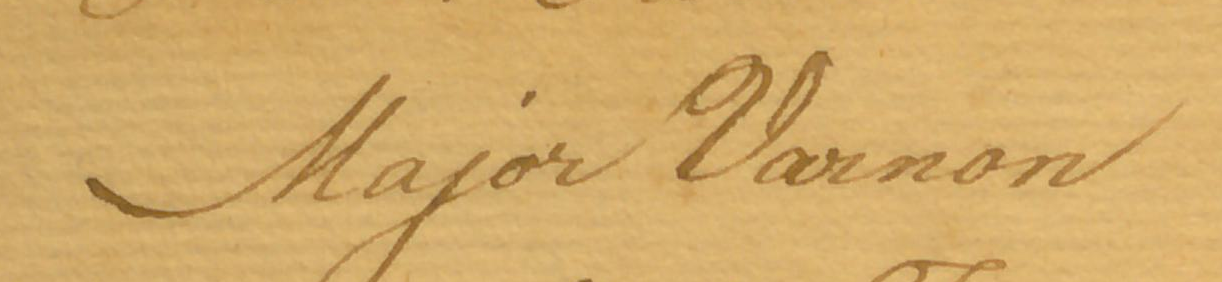Major Varnon
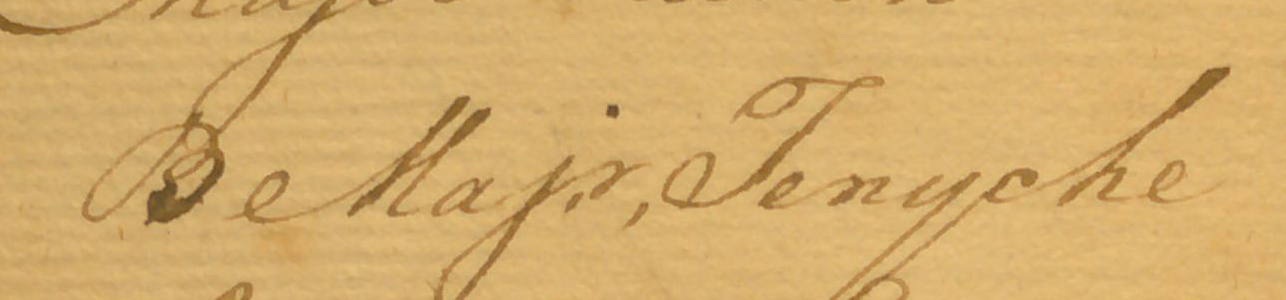B Majr. Tenyche
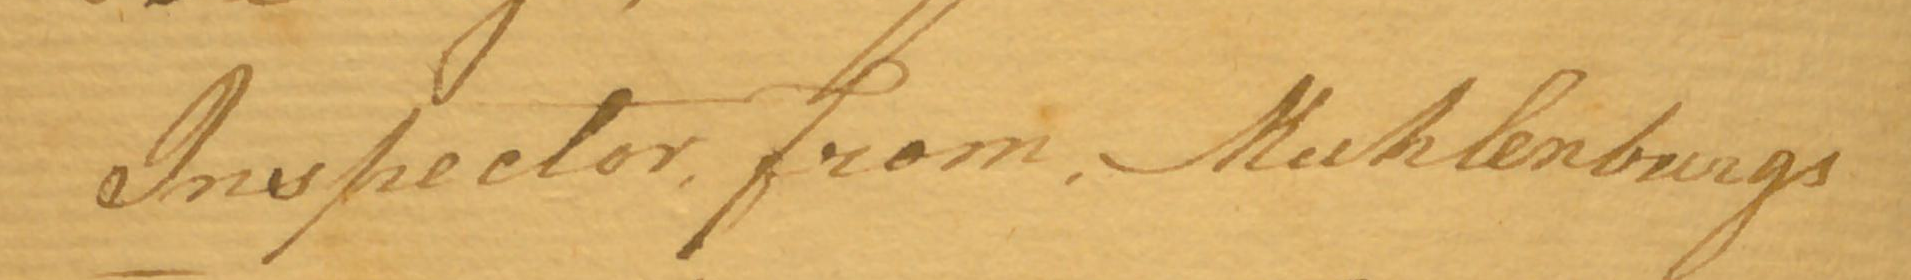Inspector from Muhlenburgs
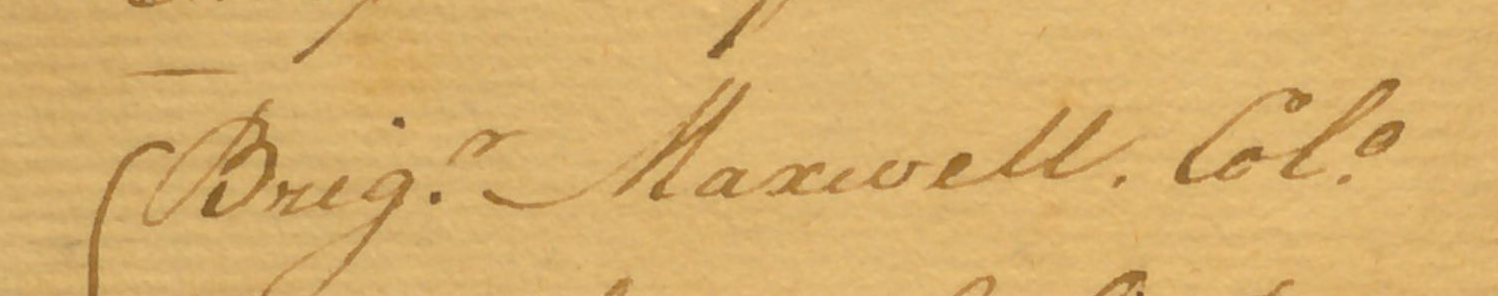Brig^r. Maxwell Col^o.
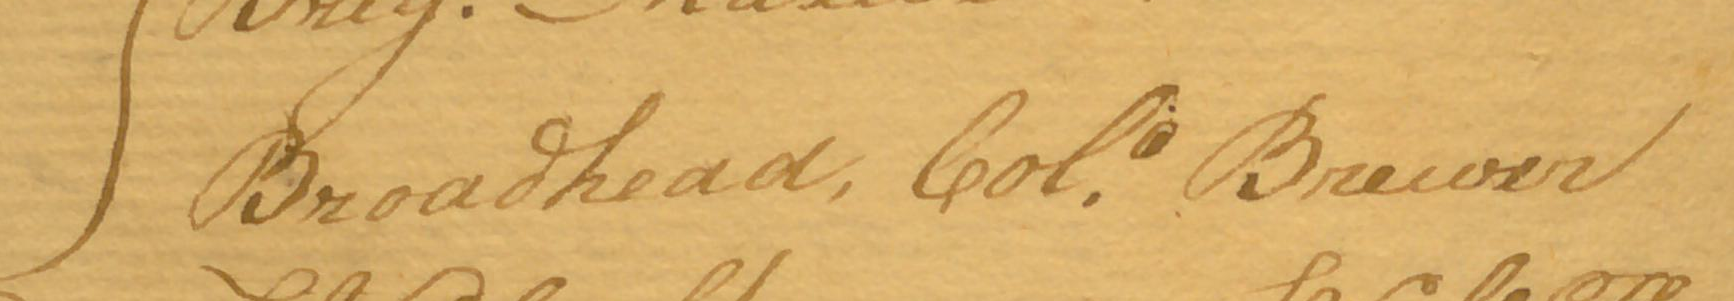Broadhead, Col^o. Brewer
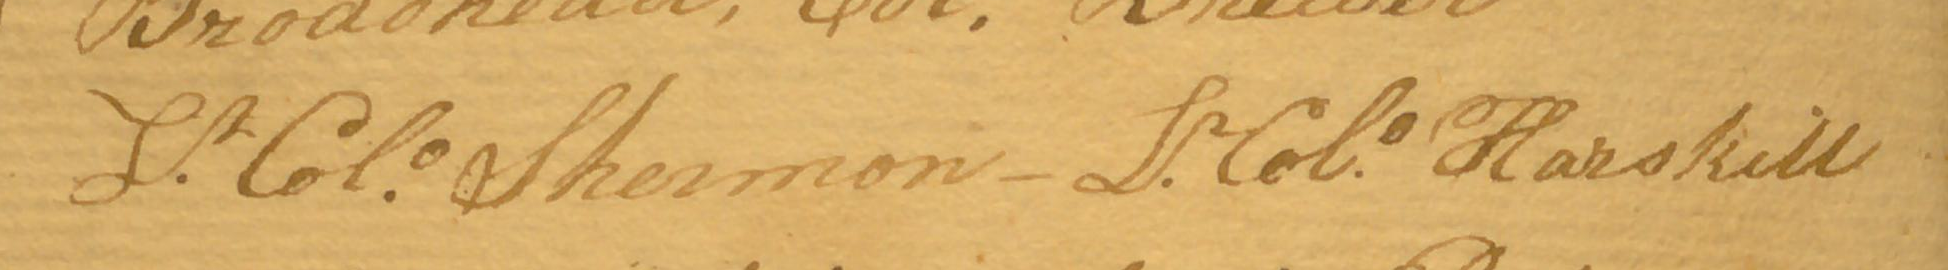L^t. Col^o. Shermon- L^t. Col^o. Harskill
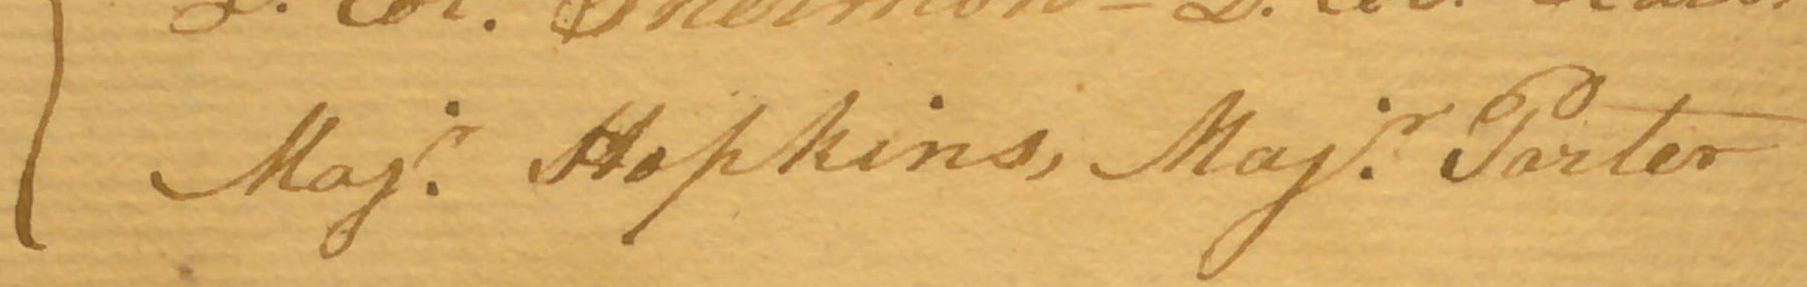Maj^r. Hopkins, Maj^r. Porter
